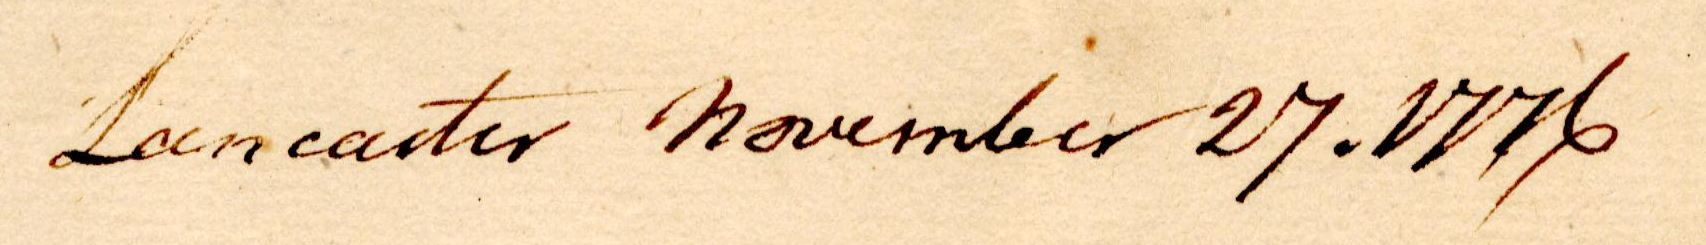Lancaster November 27. 1776
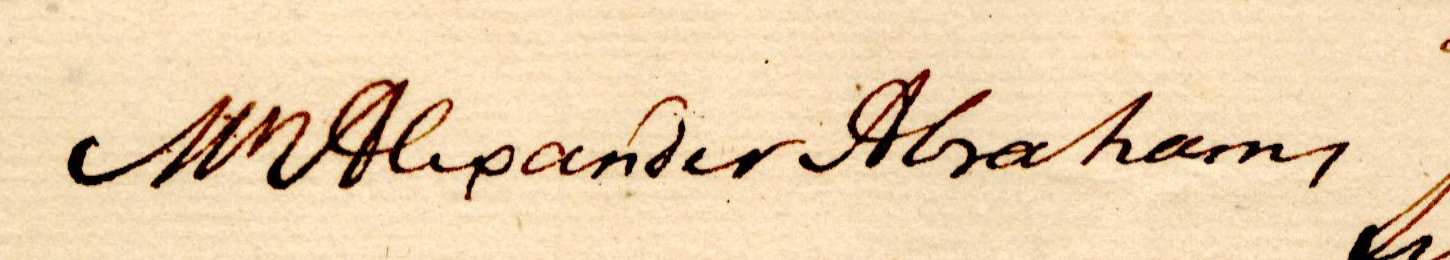M^r Alexander Abraham,
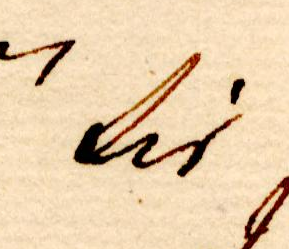Sir
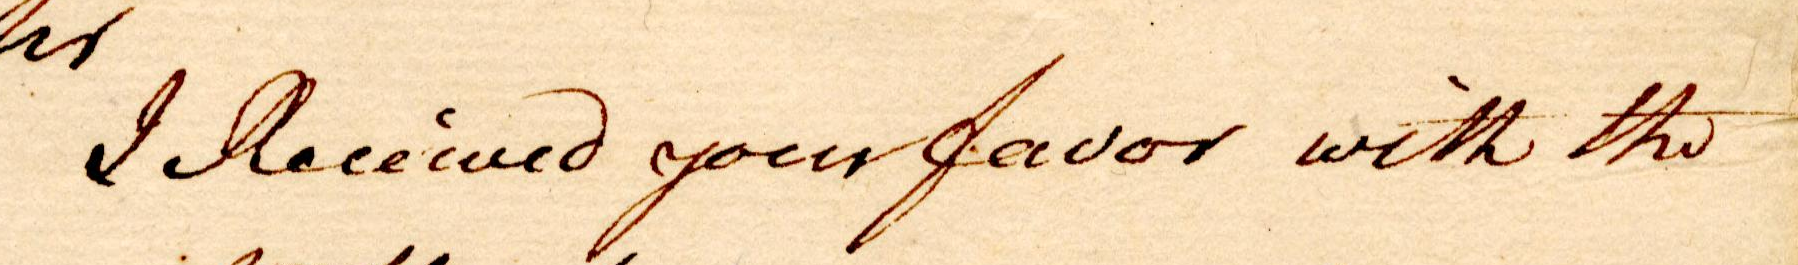I received your favor with the
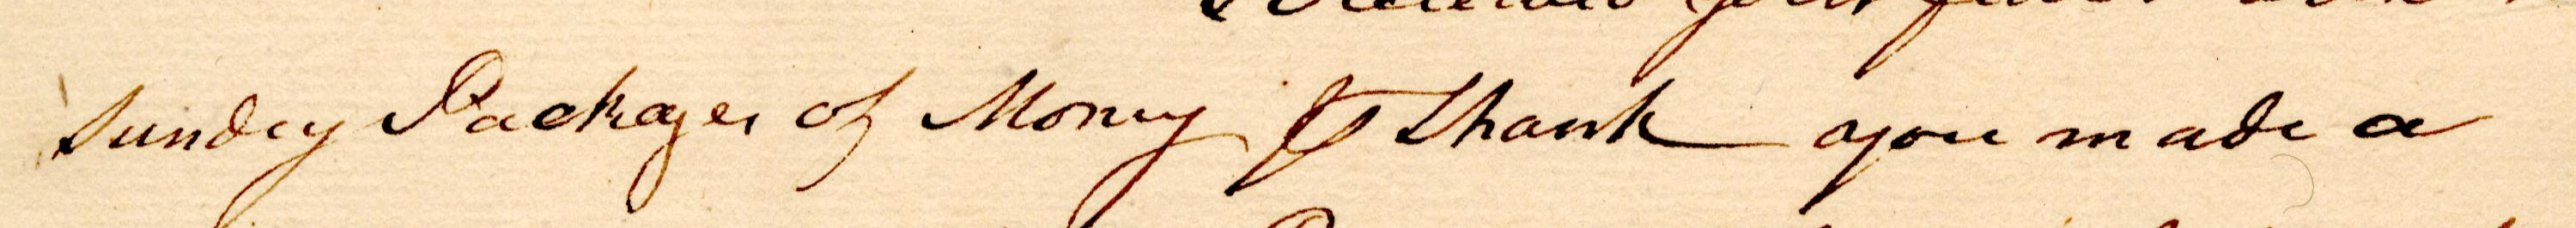Sundry Packages of Money per Shank you made a
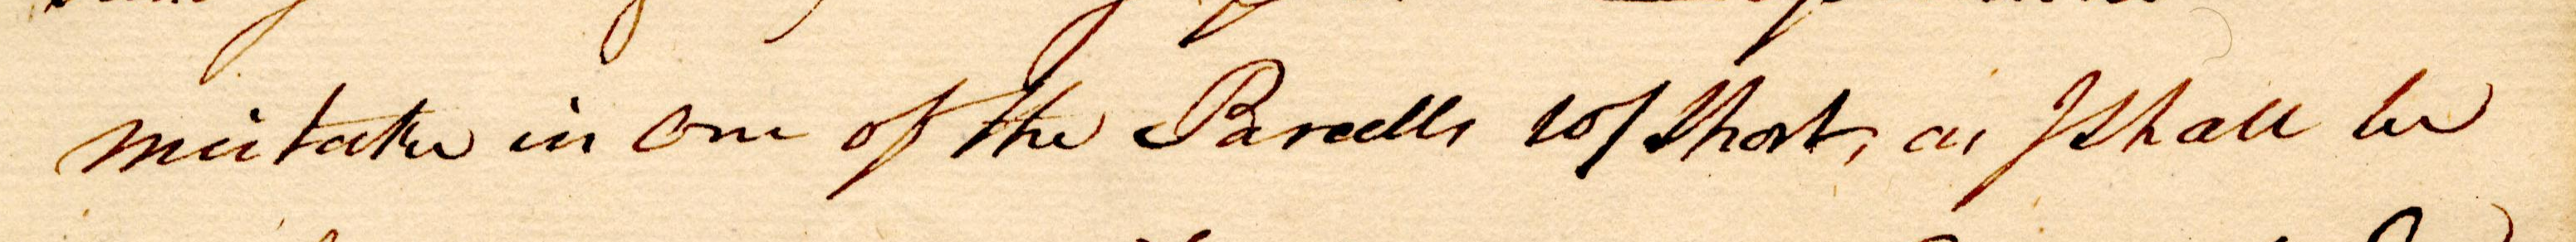mistake in one of the Parcells 10s Short, as I shall be
